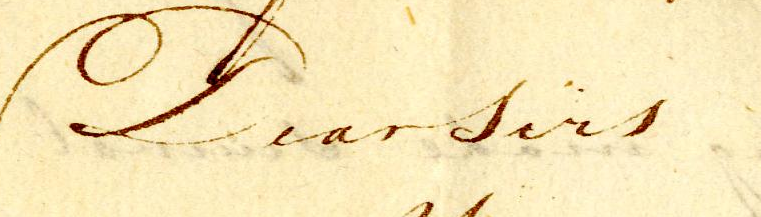Dear Sirs
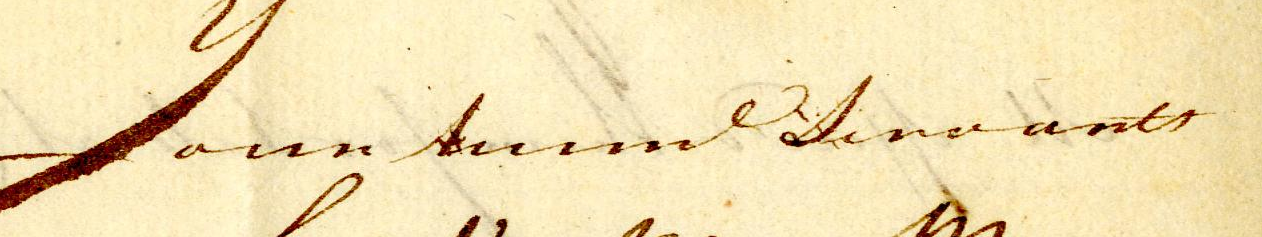Your hum^l Servant
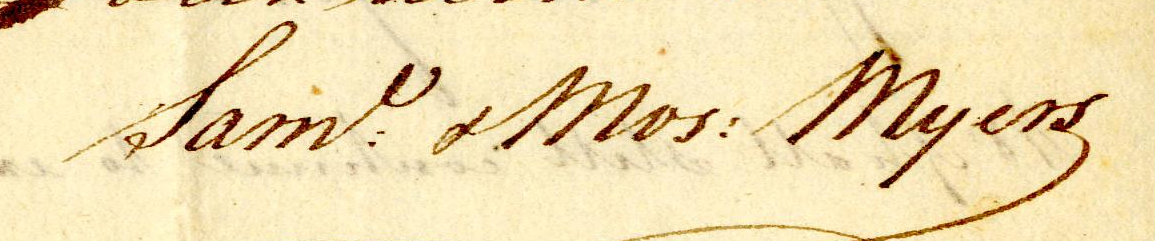Sam^l: & Mos: Myers,
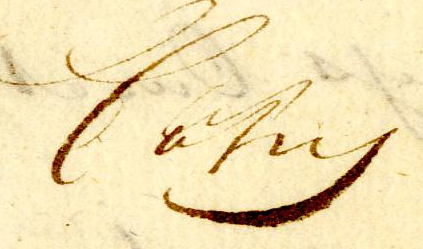Copy
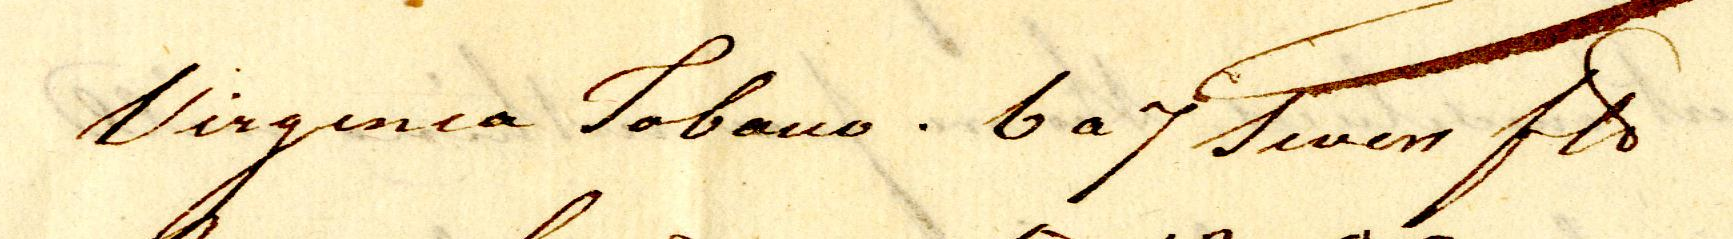Virginia Tobaco. 6 a 7 Seven Hhd
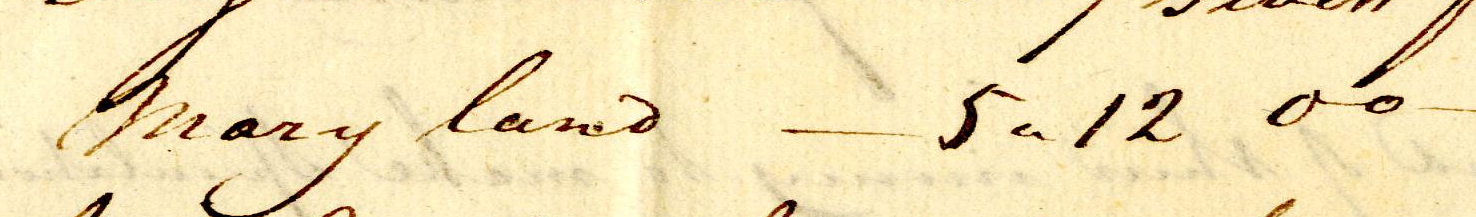Mary land- 5 a 12^00
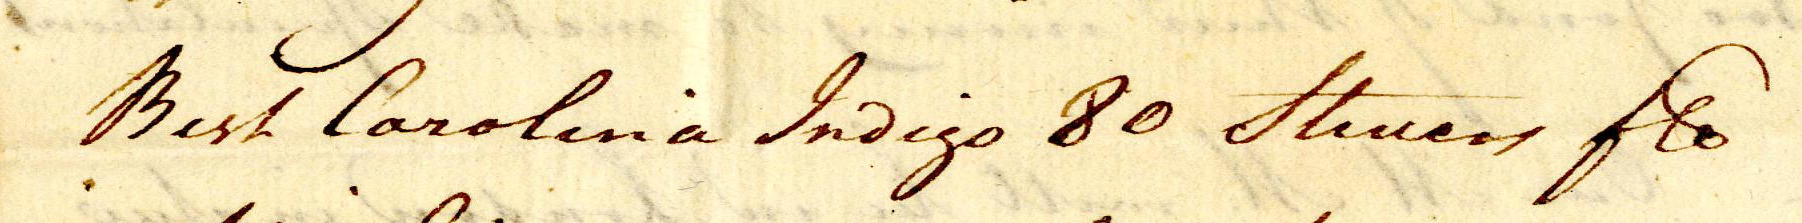Best Carolina Indigo 80 Stevers Hhd
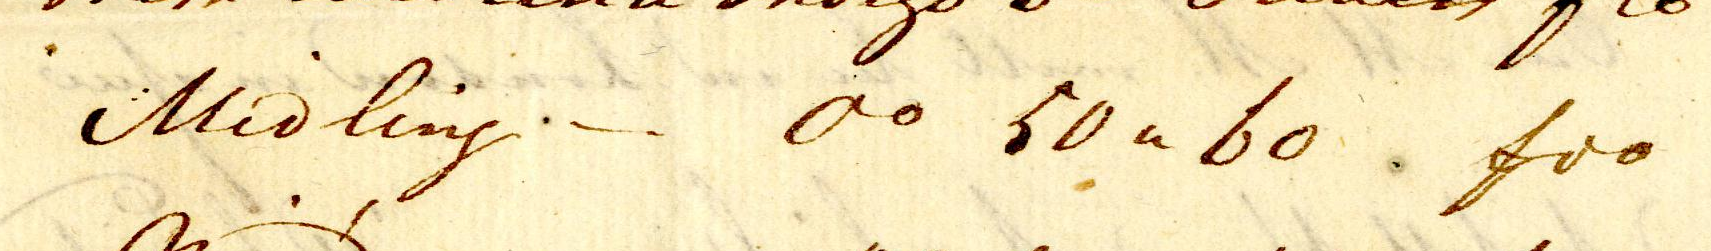Midling.- Ao 50 a 60 &ca
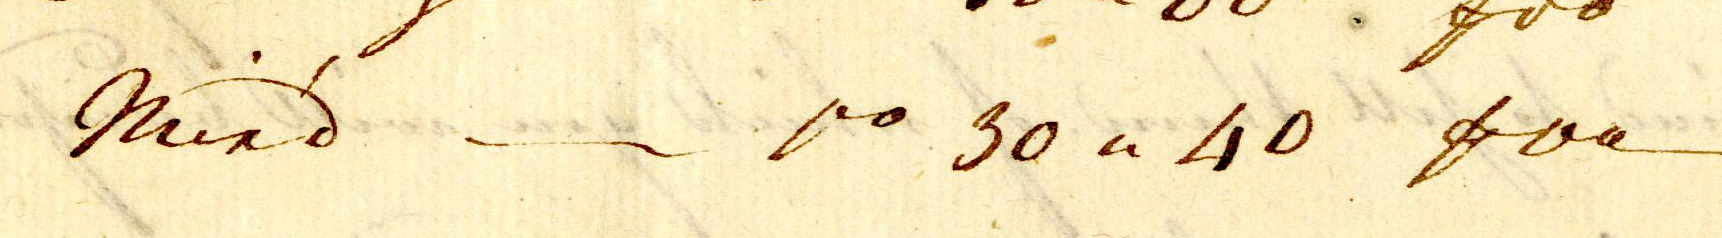mix'd.- 1^o 30 a 40 &ca
